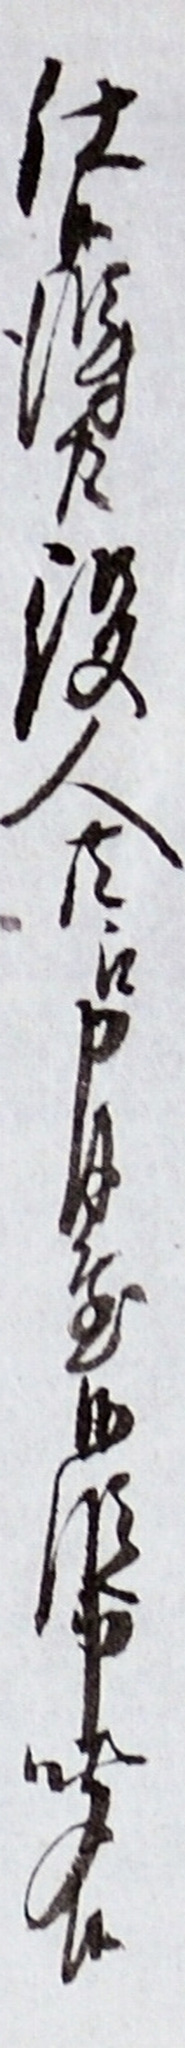仕候得共役人共江申付置候段申聞候
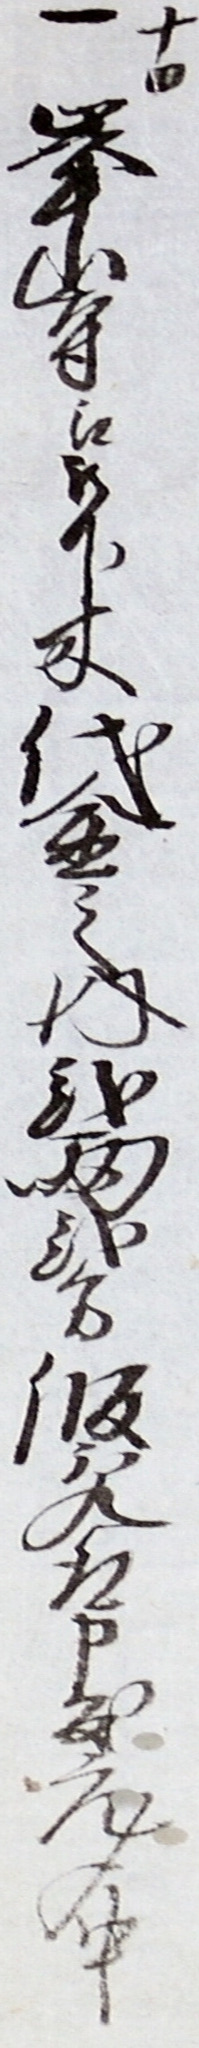一峯山寺江被下木代金之内弐両弐分仮受取申度元〆中
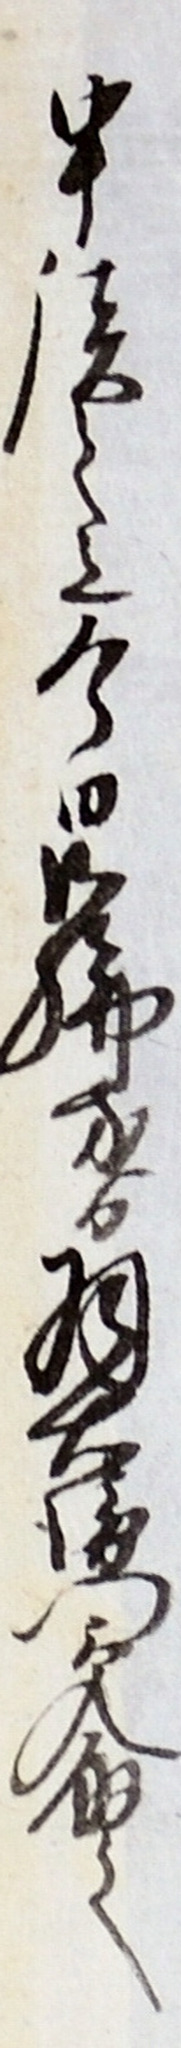申談之上今日御締方より羽右衛門受届候
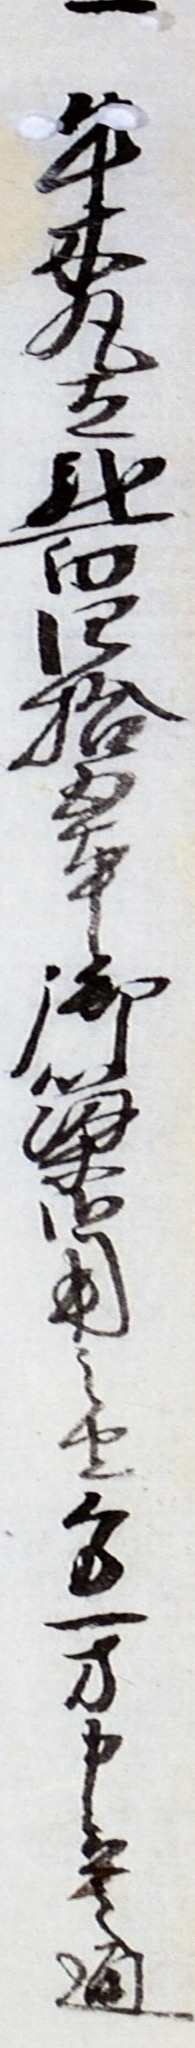一草木丸太弐百四拾五本御築御用之由方一方申置通
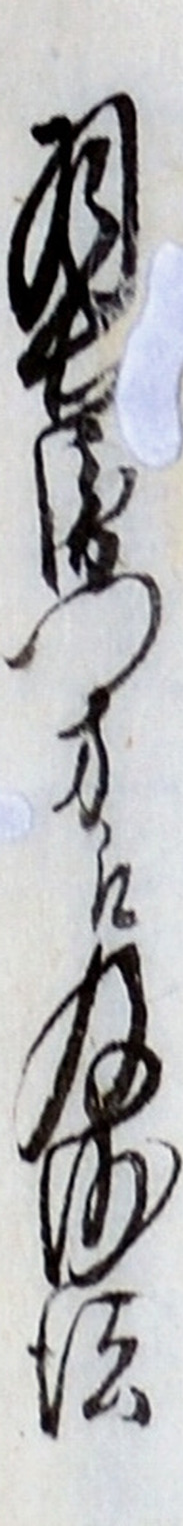羽右衛門方江及沙汰
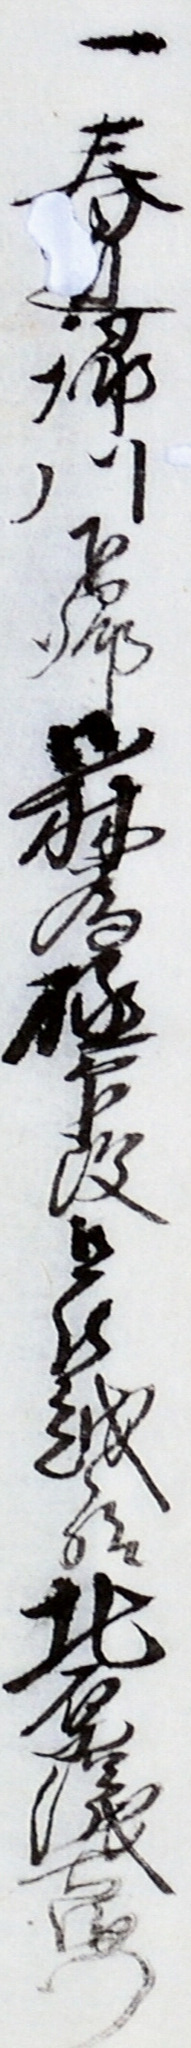一春近郷川下郷御林為極下役被罷越候様北原儀右衛門
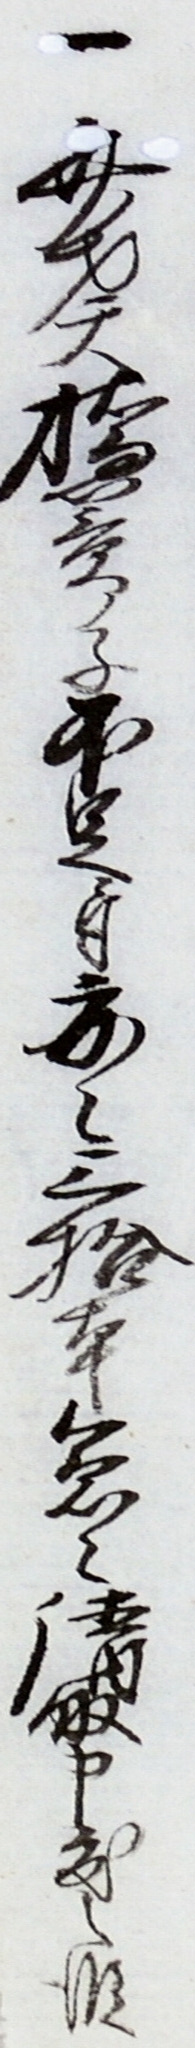一弁才天橋簀ノ子不足ニ付亦々三拾本急々請取申度之段
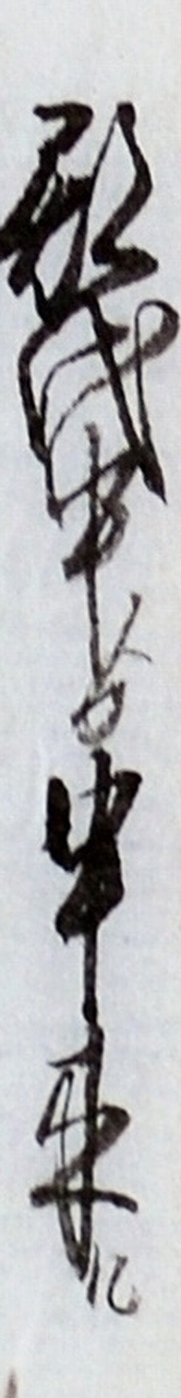郡代中より申来ル
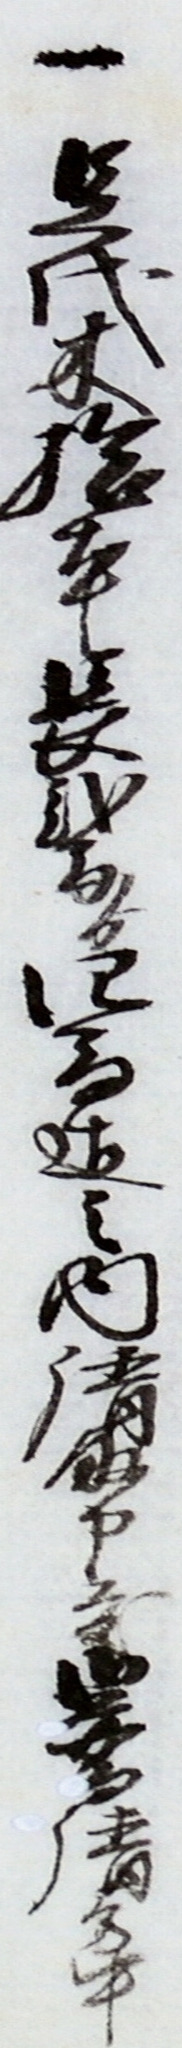一足代木拾本長弐両より四間迄之内請取申上御普請方中
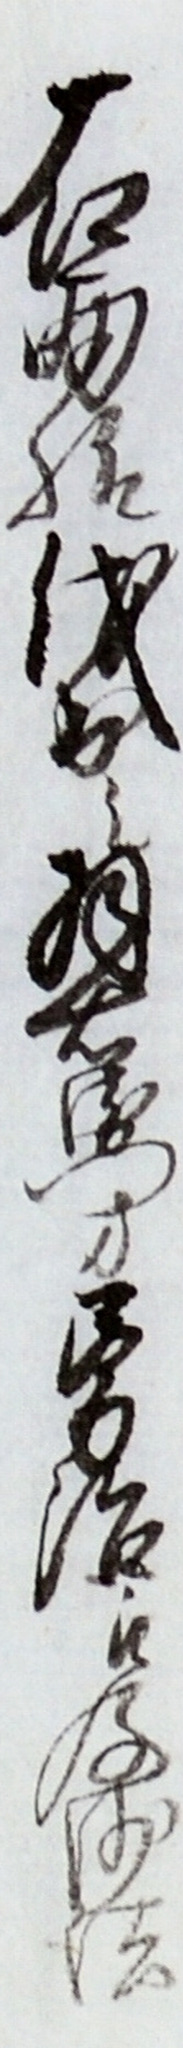右両様伐出し羽右衛門方勇治江及沙汰
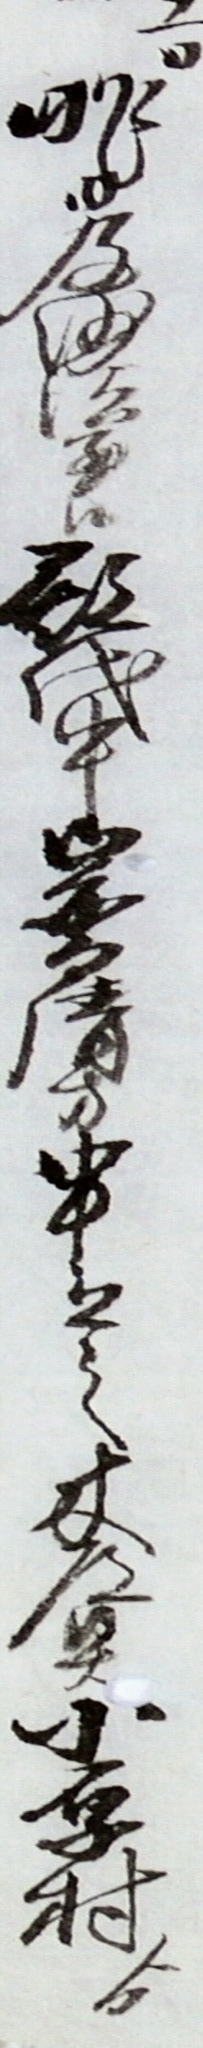昨日及沙汰御郡代中御普請方中有之木道具小原村より
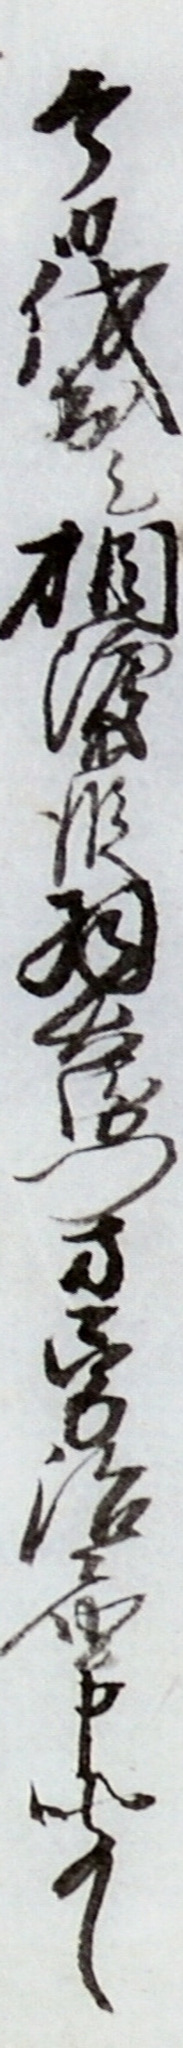今日伐出し相渡候羽右衛門方勇治届申聞候
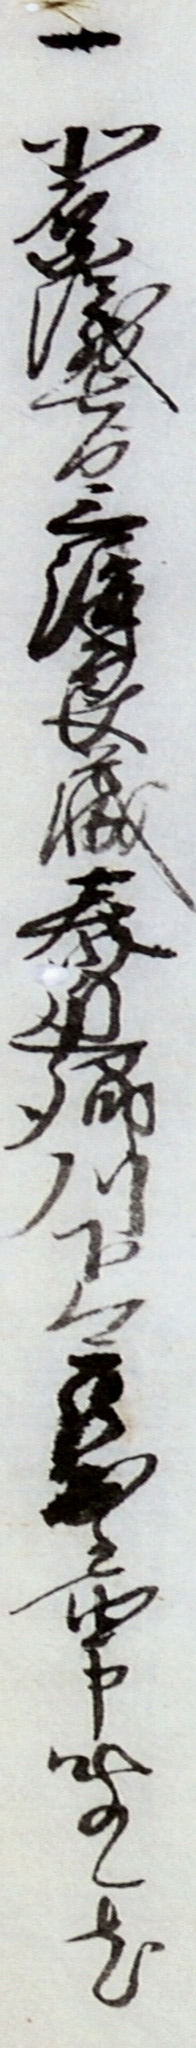一北原儀右衛門三溝良蔵春近郷川下郷罷出申聞候尤

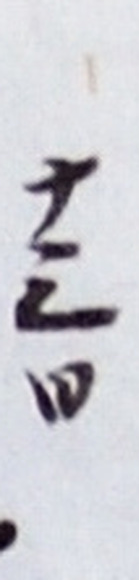十三日
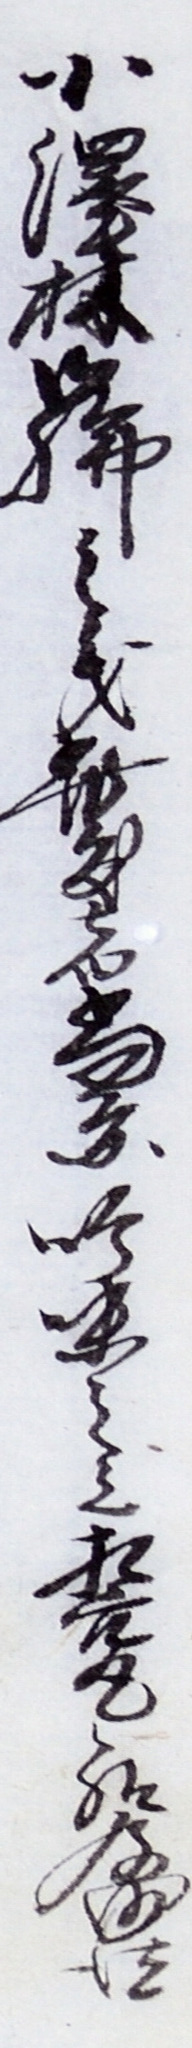小沢林御払之義此度は当亦吟味之上相究候様及沙汰
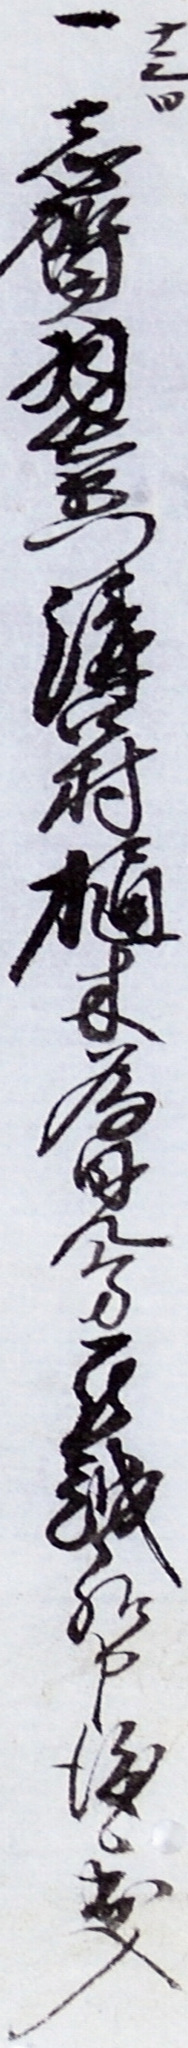一志賀羽右衛門溝口村樋木為見分罷越候様申渡候出入
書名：御山奉行御用控
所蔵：伊那市立高遠町図書館・合同会社AMANE
